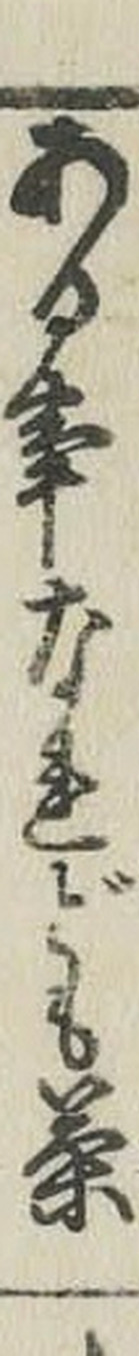ある事なれども茶
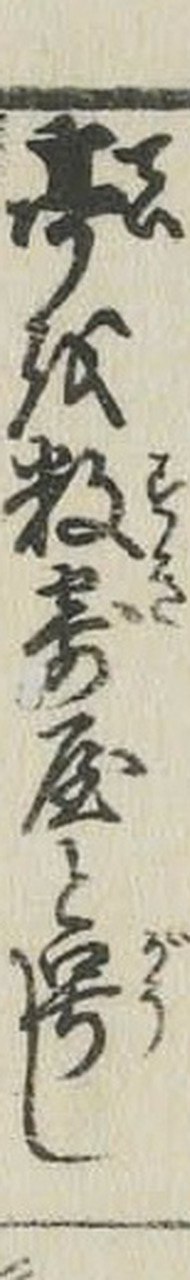亭を数寄屋と号し
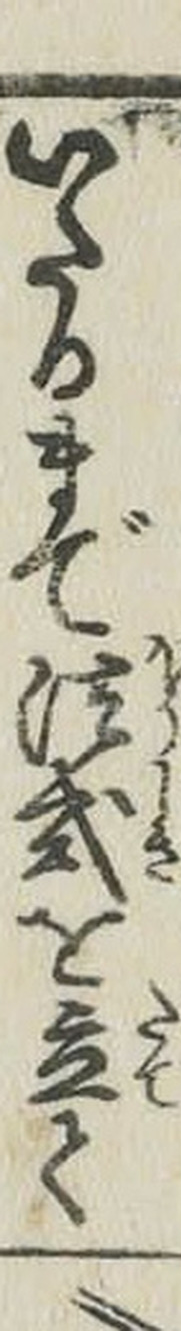いたるまで法式を立て
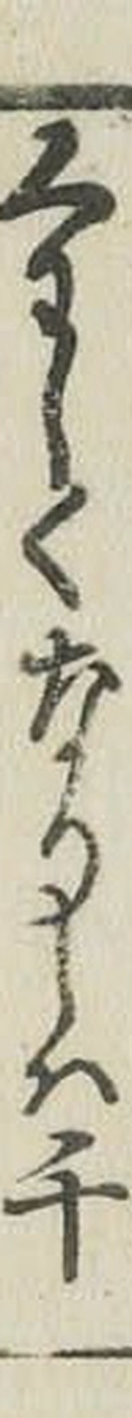くわしくなりしは千
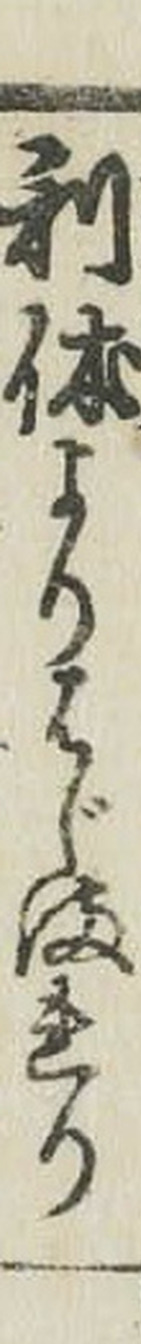利休よりはじまれり
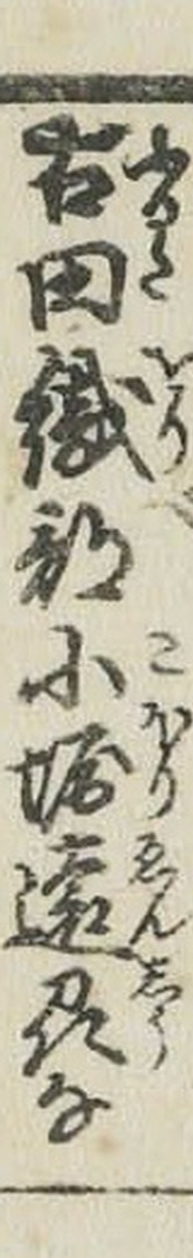古田織部小堀遠州な
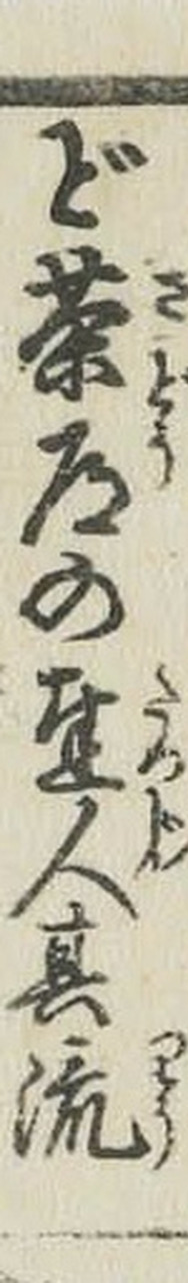ど茶道の達人其流
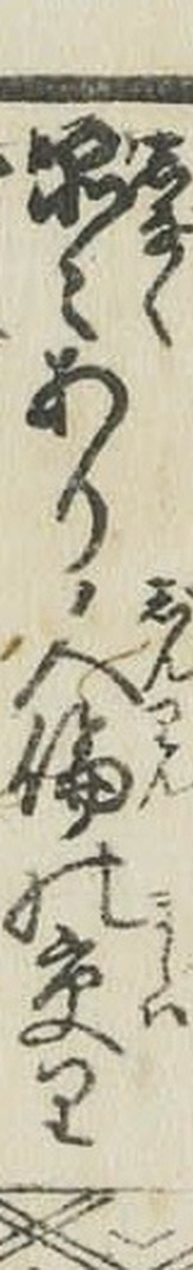品々あり人倫の交り
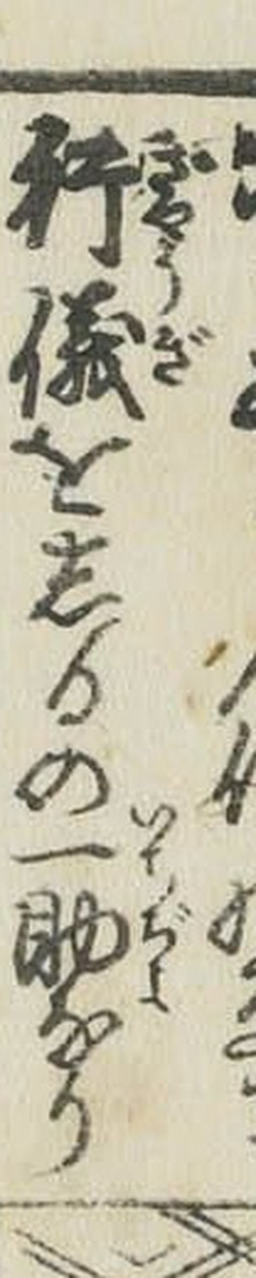行儀をしるの一助なり
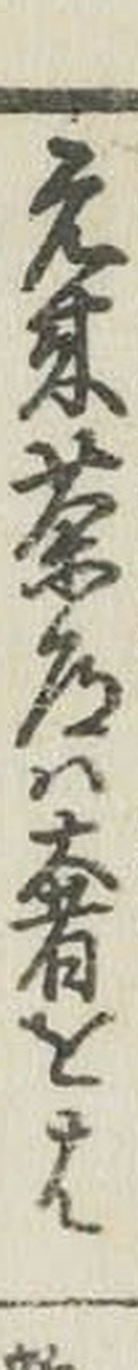元来茶道は奢をは
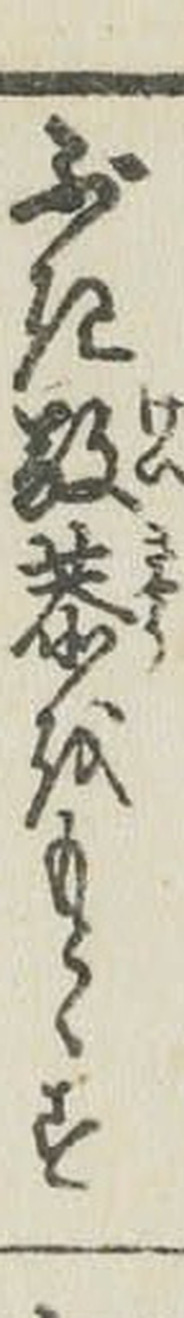ぶき敬恭をもとゝす
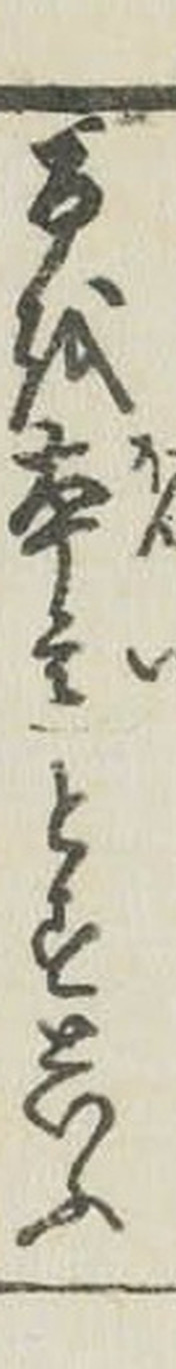るを本意とすといふ
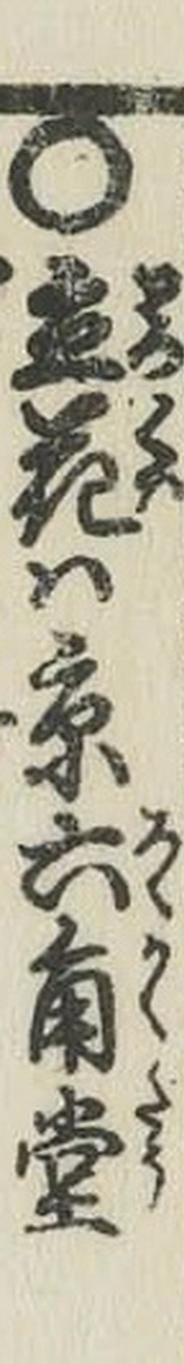○立花は京六角堂
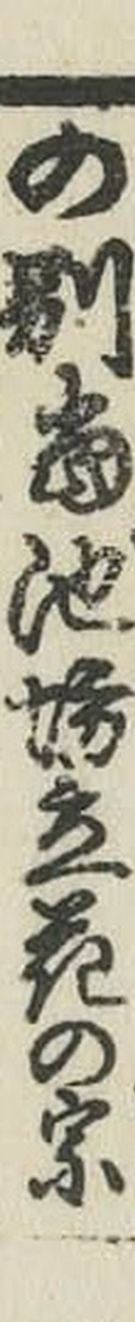の別当池坊立花の宗
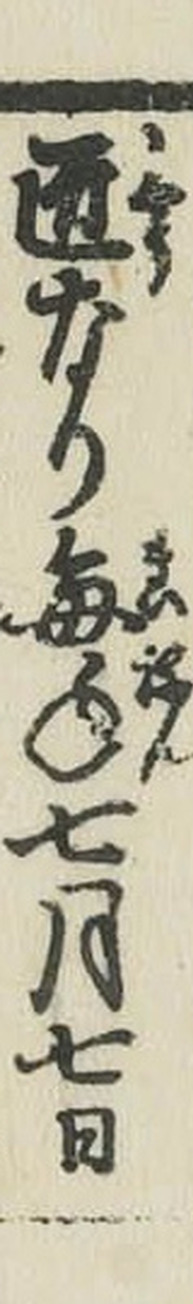匠なり毎年七月七日
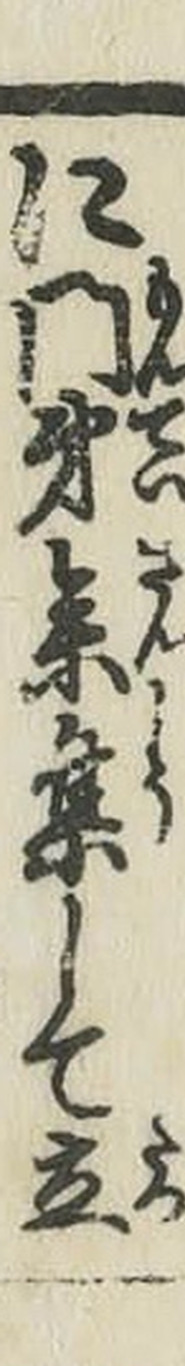に門弟参集して立
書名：増補頭書訓蒙図彙大成 10巻 10:巻之21
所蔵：東京学芸大学教育コンテンツアーカイブ
